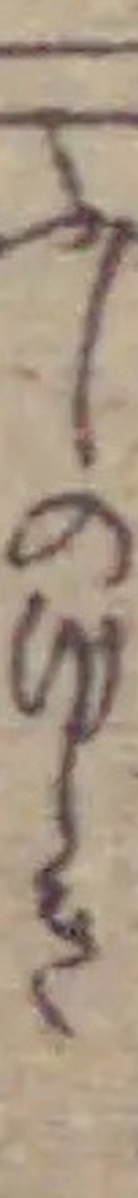ふしのゆき
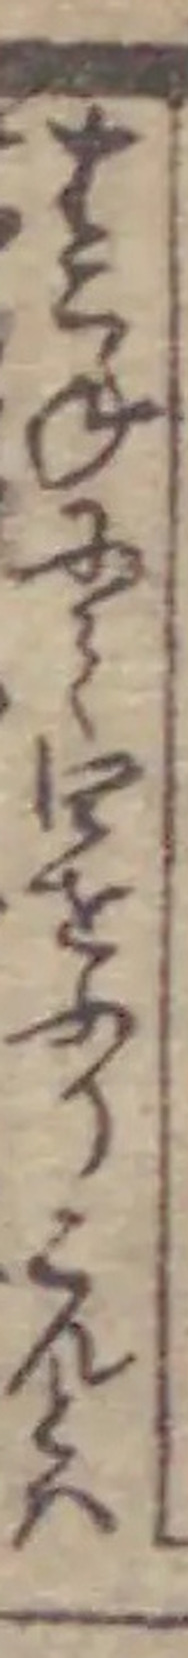はこねにて四をふりこんとは
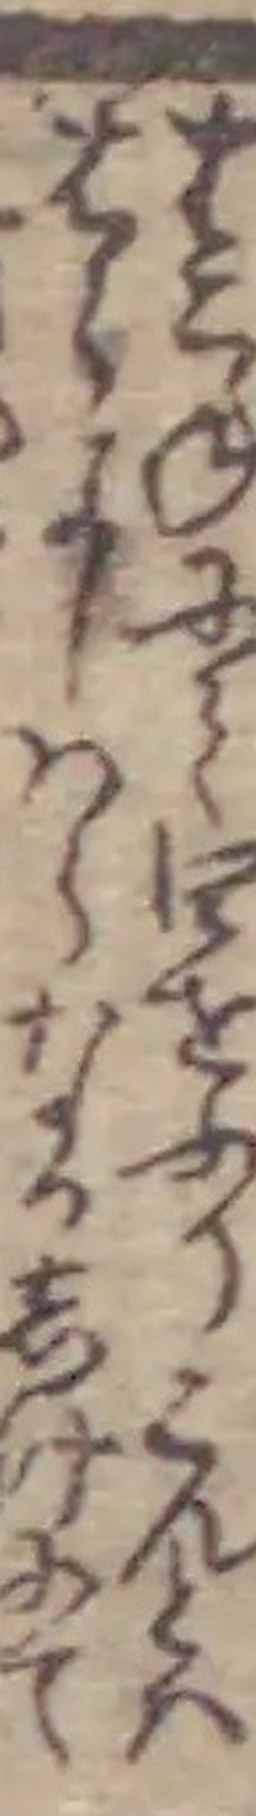はらよしはらなかしけにて
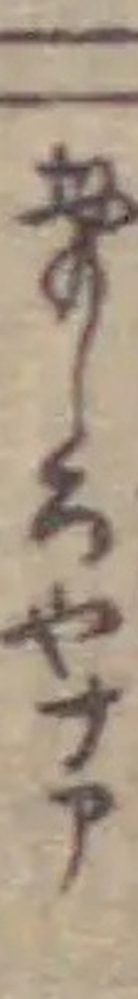おもしろやナア
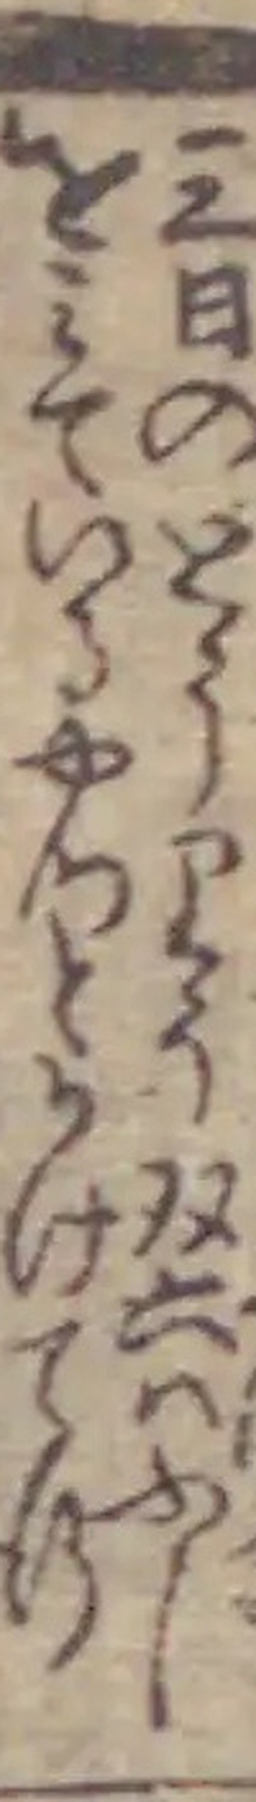をみているやつとかけて行
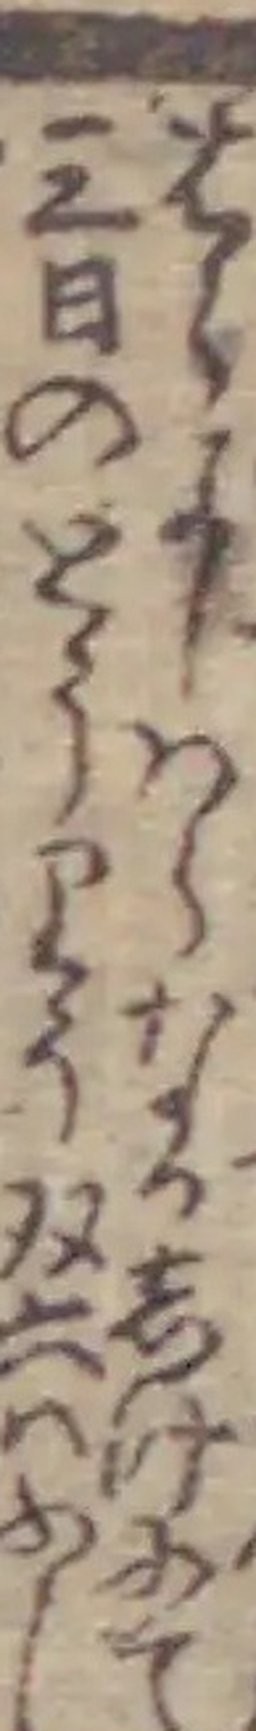三日のとうりう双六はふし
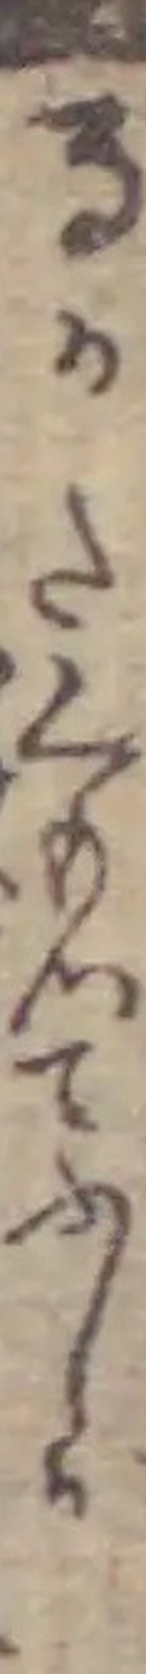馬かたくもつてふしか
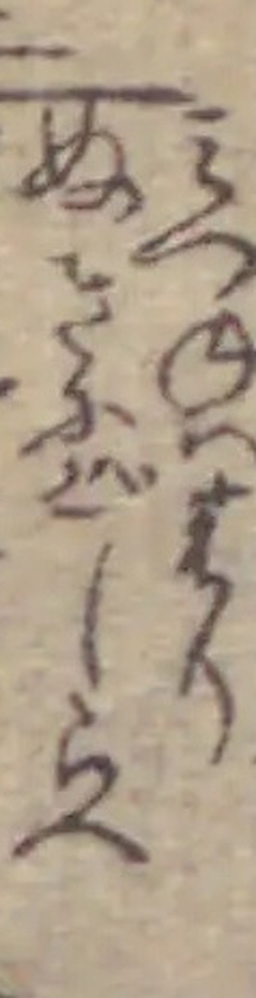ぬきにしらへ
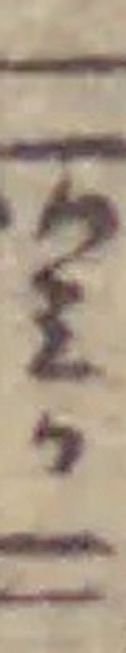かみか
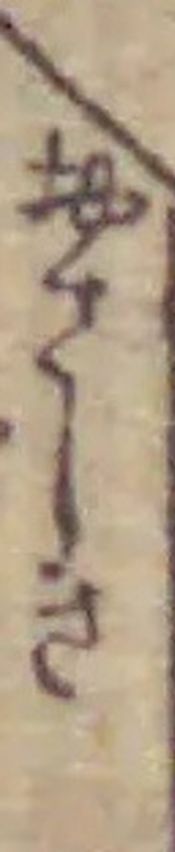おさしき
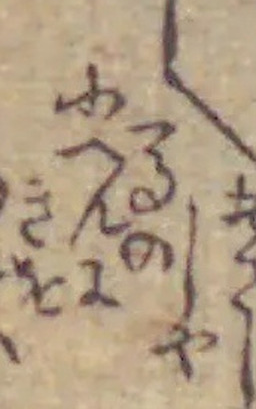小へんに
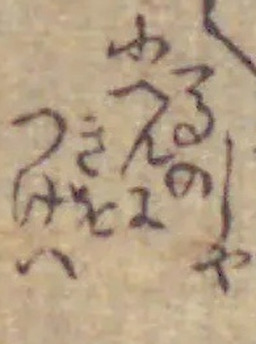つけい
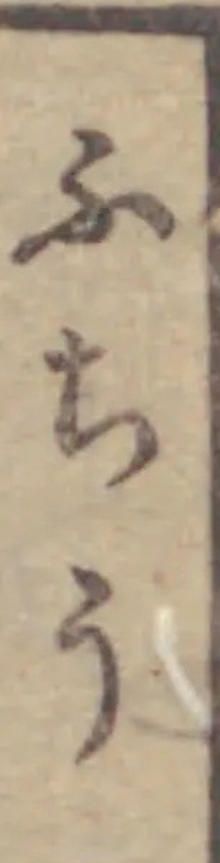ふちう
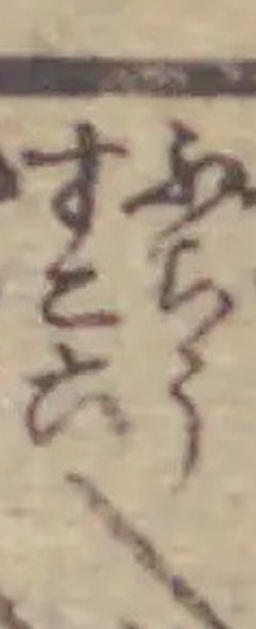すこ六
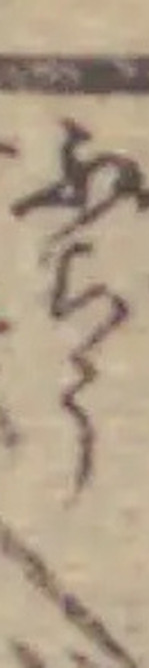ふちう
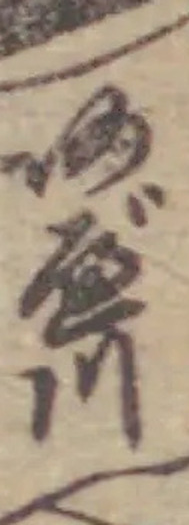あへ川
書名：道笑双六
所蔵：国立国会図書館 National Diet Library, JAPAN
